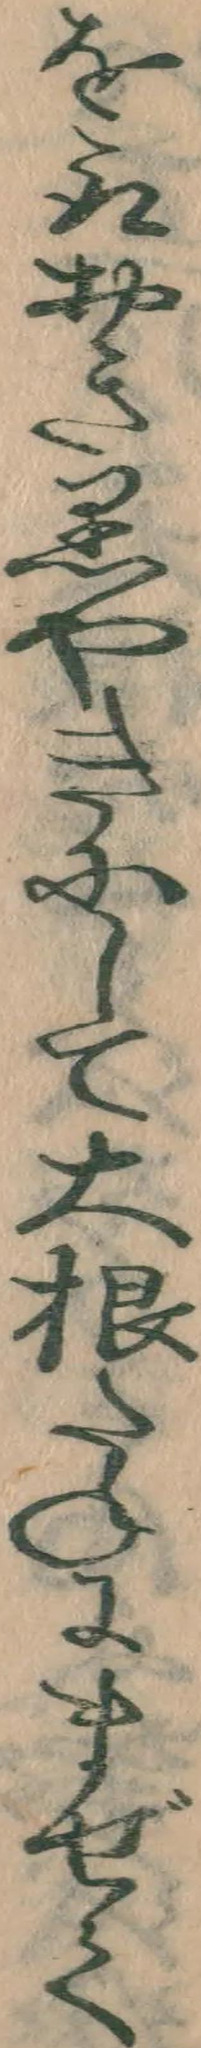を取おき黒やきにして大根たねにまぜて
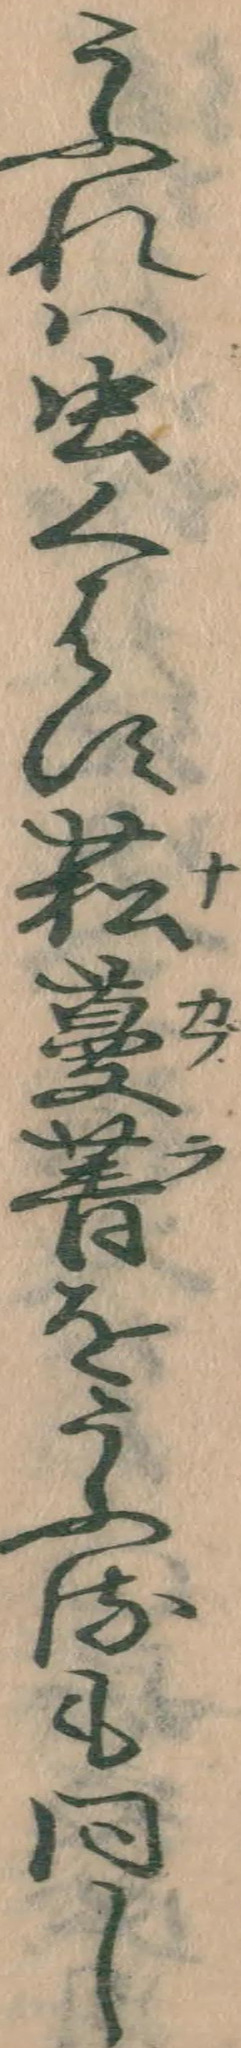うふれは虫くはす菘蔓菁をうふるも同し
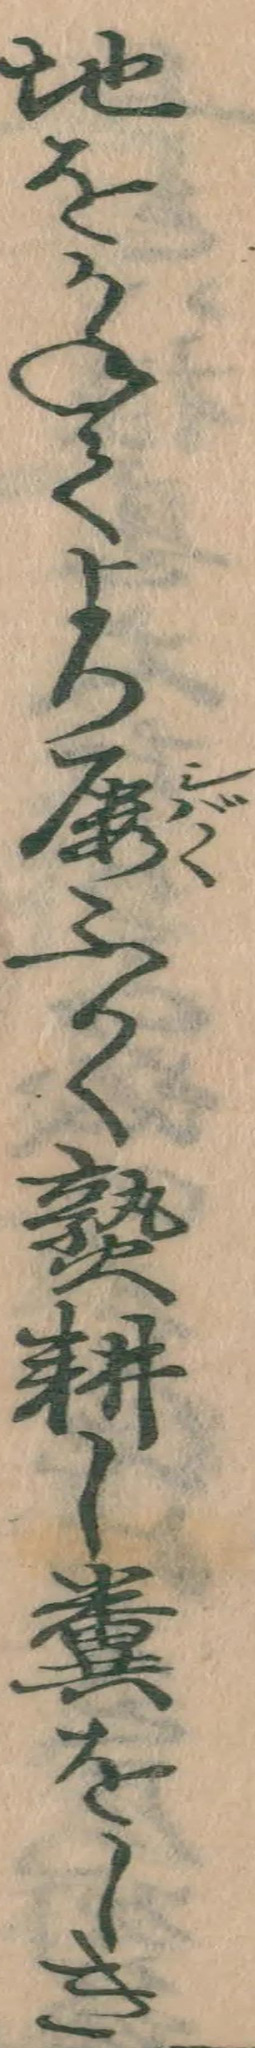地をかねてより屡ふかく熟耕し糞をしき
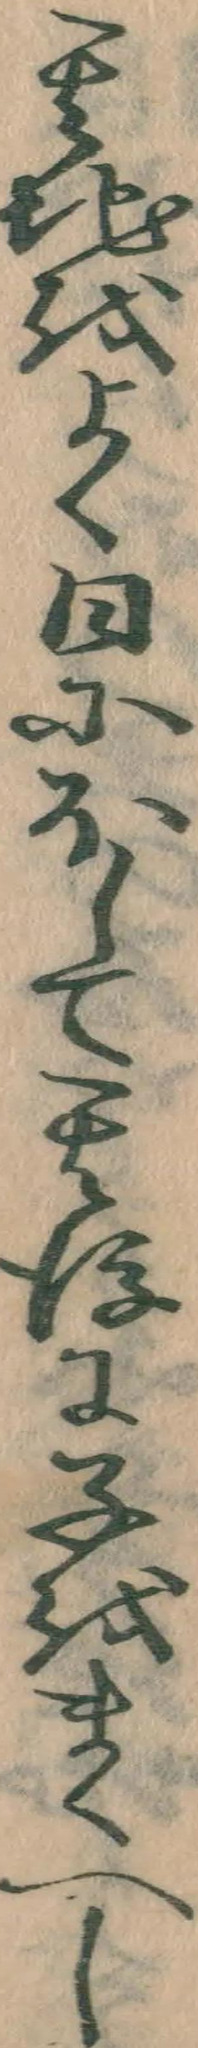其地をよく日にほして其後に子をまくへし
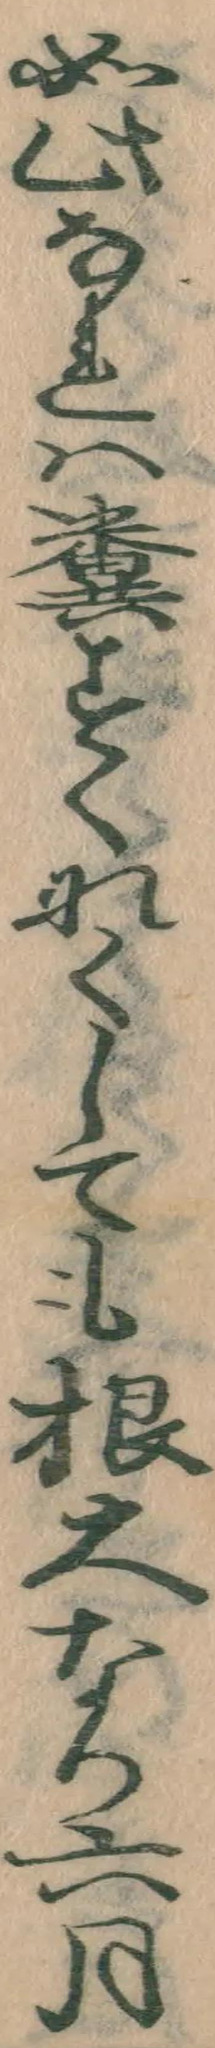如此なれは糞すくなくしても根大なり六月
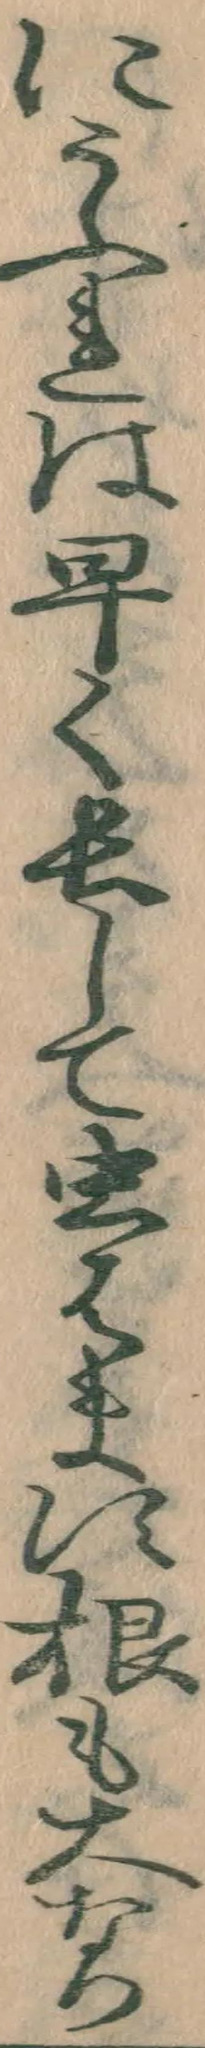にうふれは早く長して虫はます根も大なり
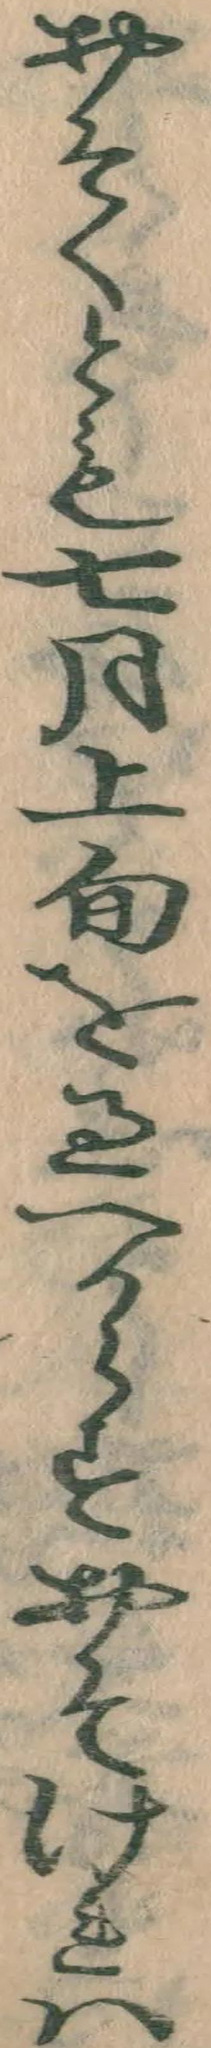おそくとも七月上旬を過へからすおそけれは
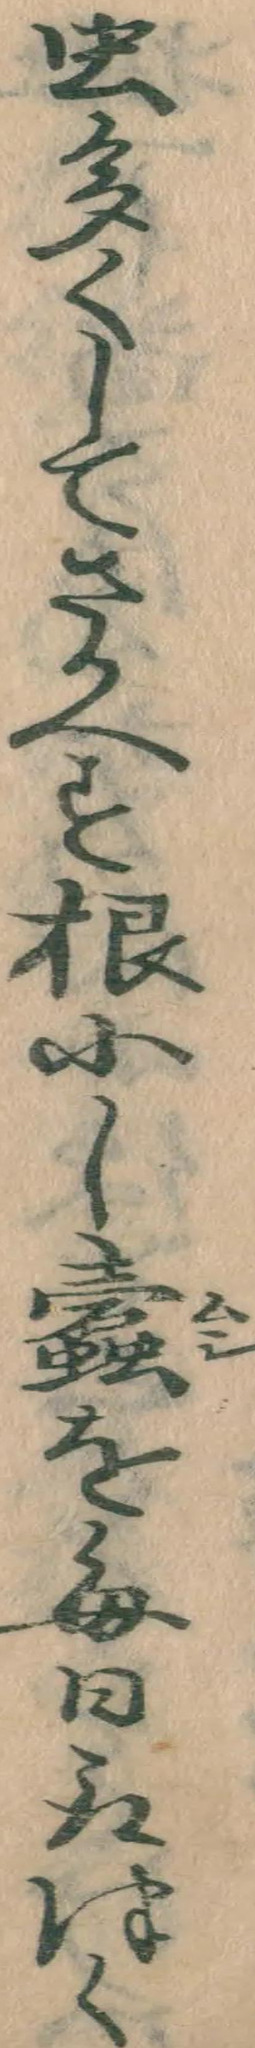虫多くしてさかへす根小し蠧を毎日取つく
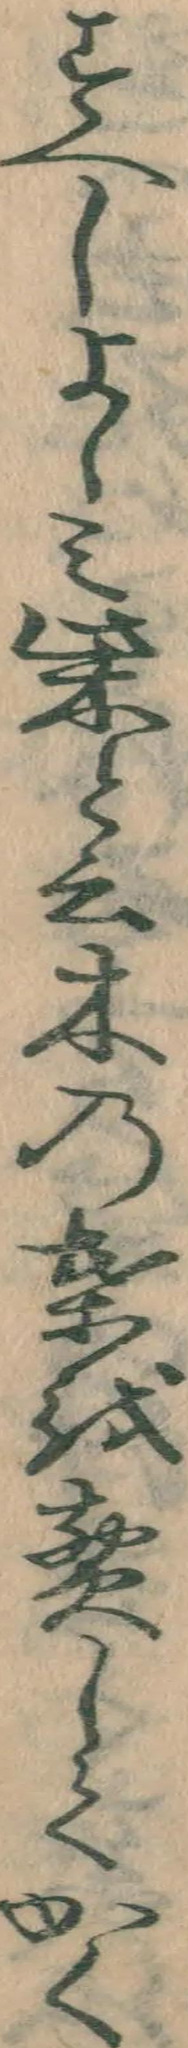すへしよしみ柴と云木の葉を煎してかく

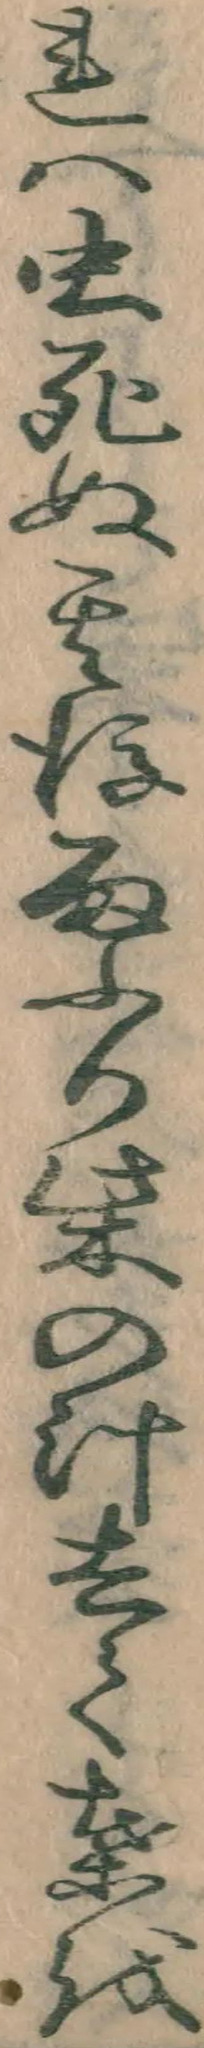れは虫死ぬ其後雨ふり柴の汁去て葉を
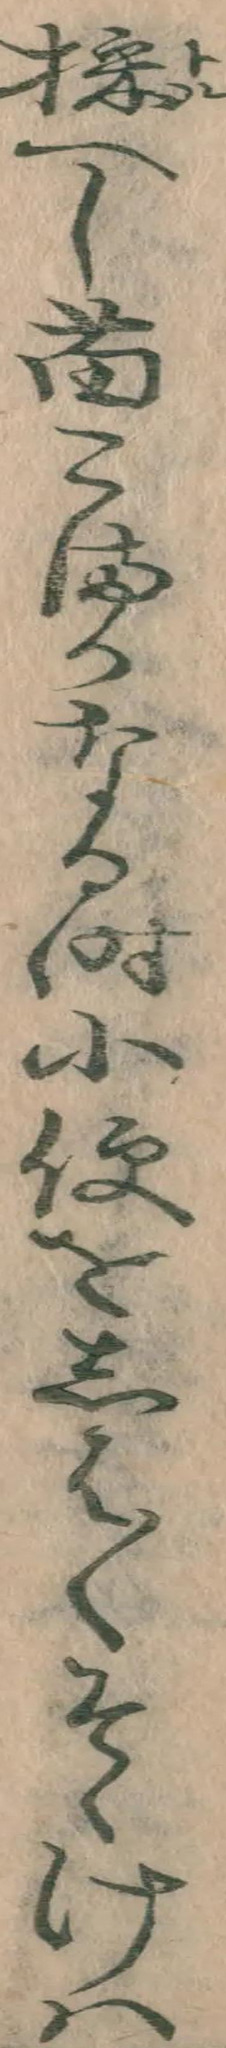採へし苗こまかなる時小便をしは〳〵そゝけは
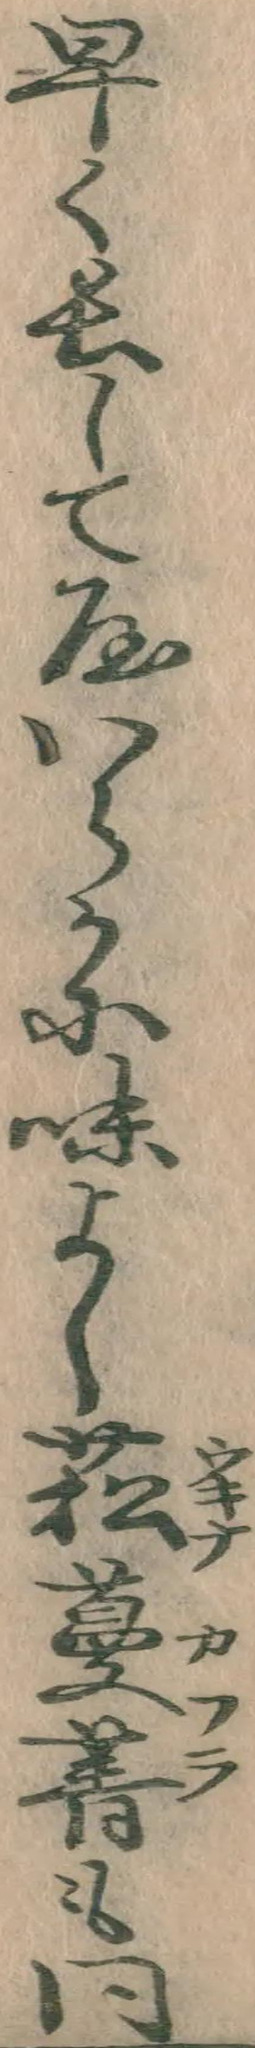早く長してやはらかに味よし菘蔓菁も同
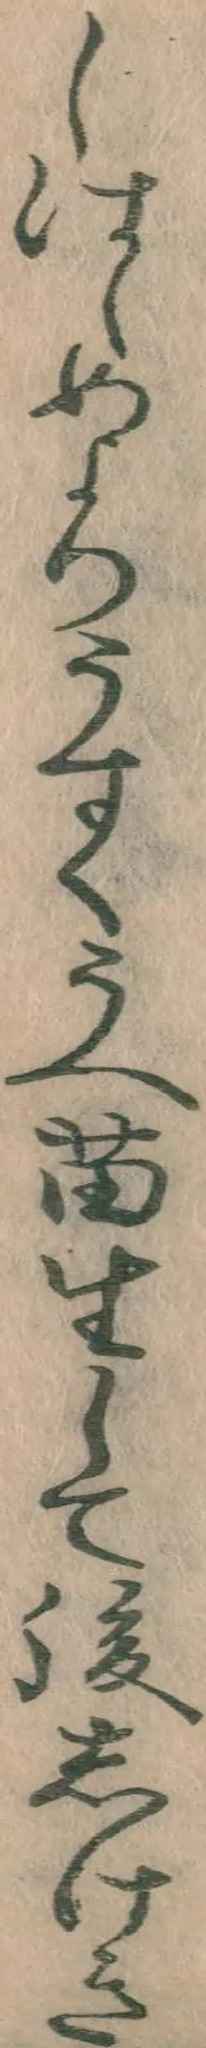しはしめよりうすくうへ苗生して後しけき
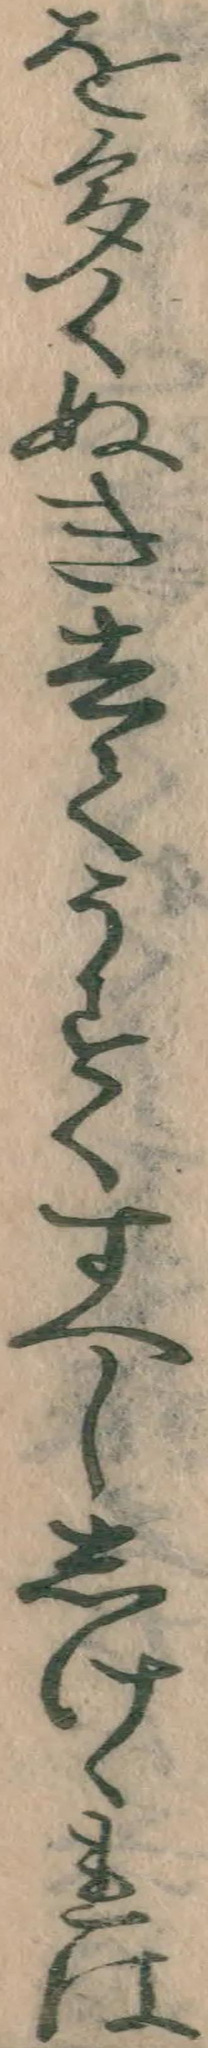を多くぬき去てうすくすへししけゝれは
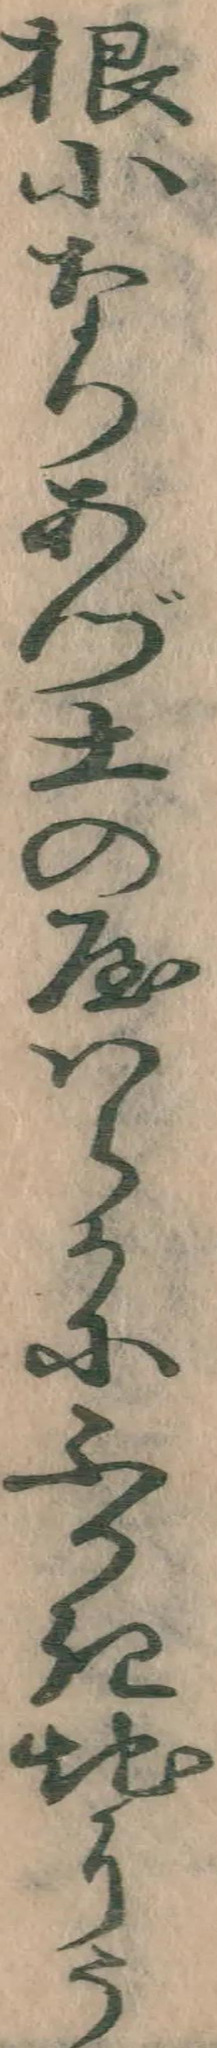根小なりあづ土のやはらかにふかき地にう
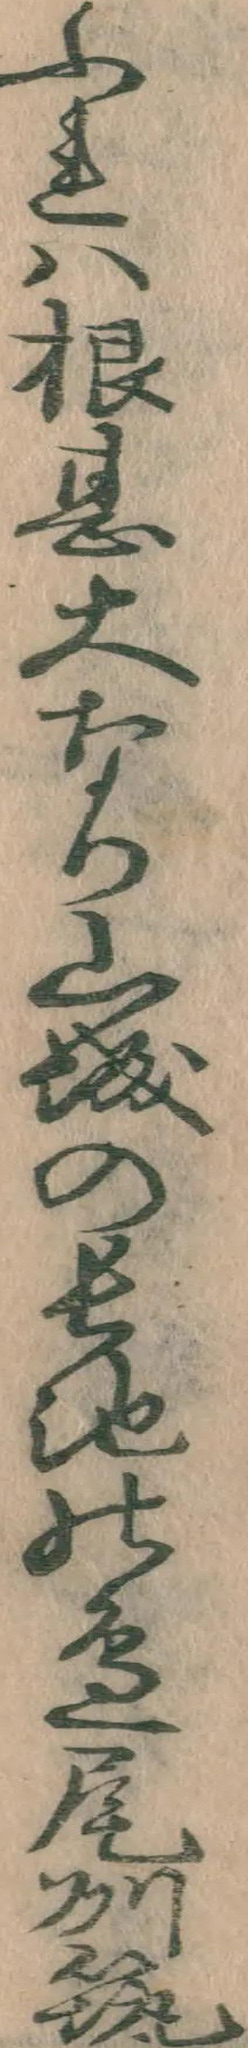ふれは根甚大なり山城の長池の辺尾州筑
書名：菜譜 3巻
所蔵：国立国会図書館 National Diet Library, JAPAN
